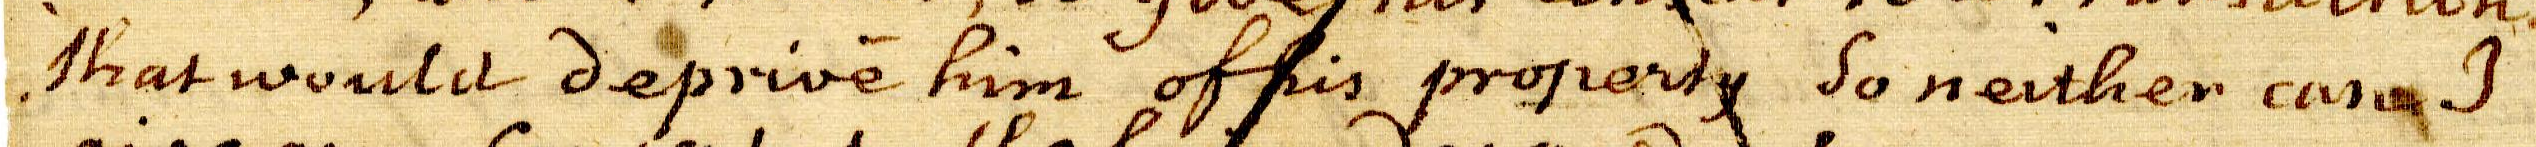that would deprive him of his property So neither can I
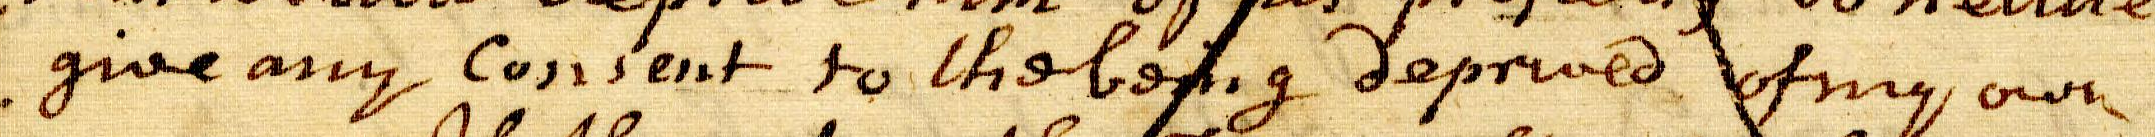give any Consent to the being deprived of my on
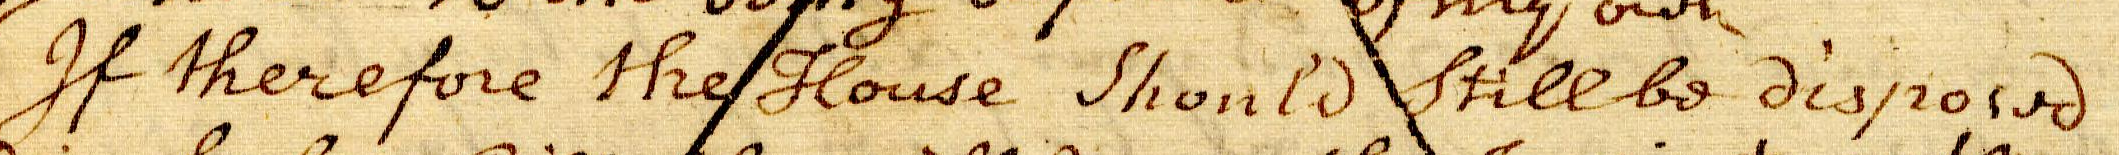If therefore the House Should still be disposed
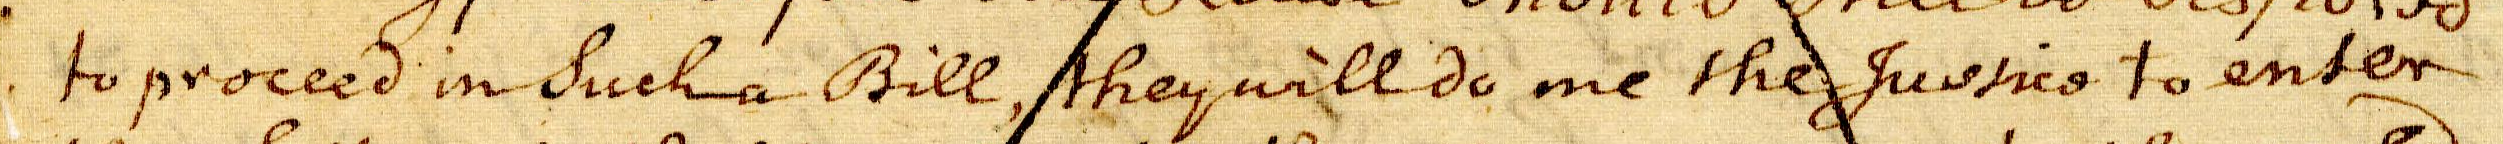to proceed in such a Bill, they will do me the Justice to enter
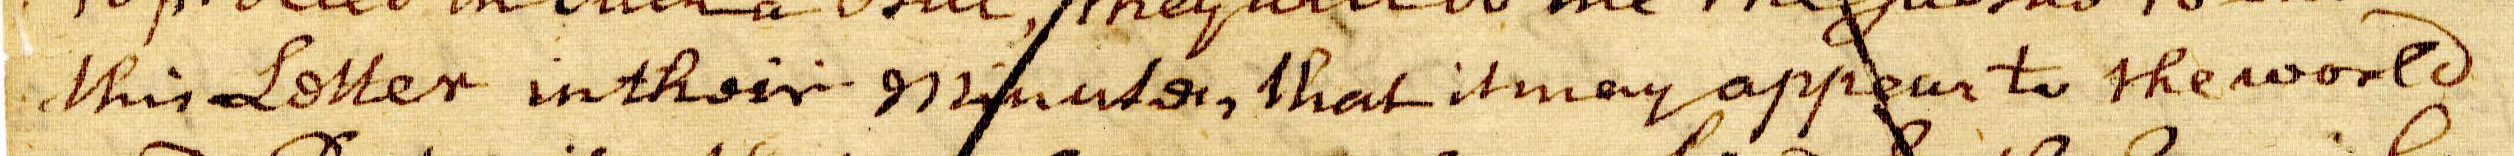this Letter in their Minutes, that it may appear to the world
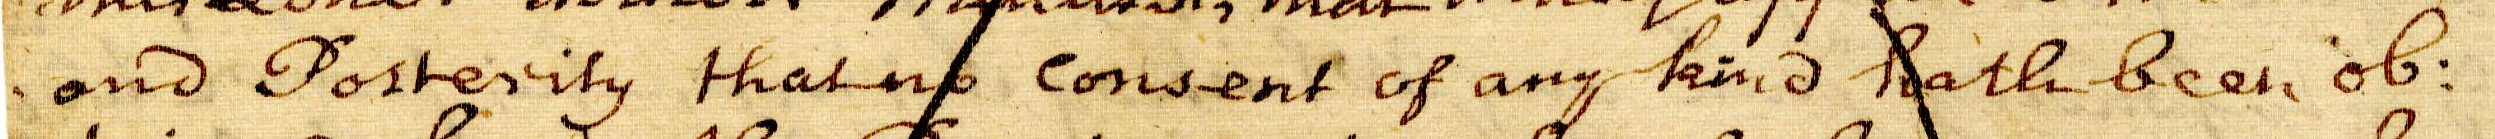and Posterity that no consent of any kind hath been ob:
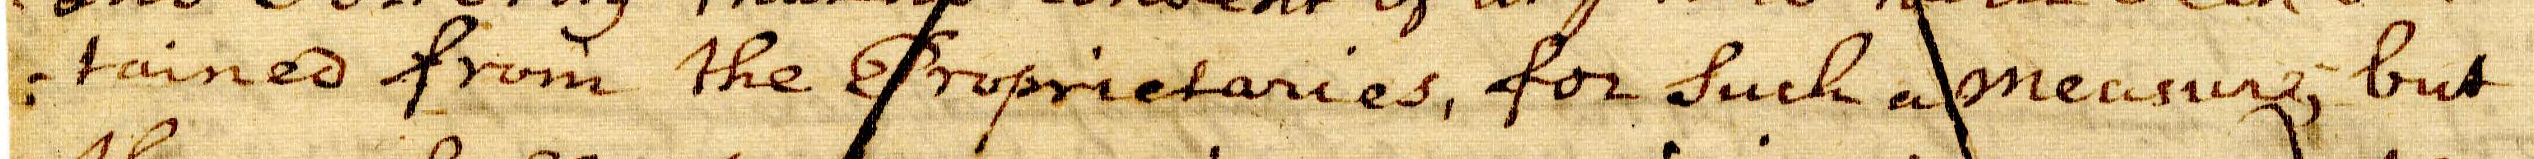-tained from the Proprietaries, for such a measure, but
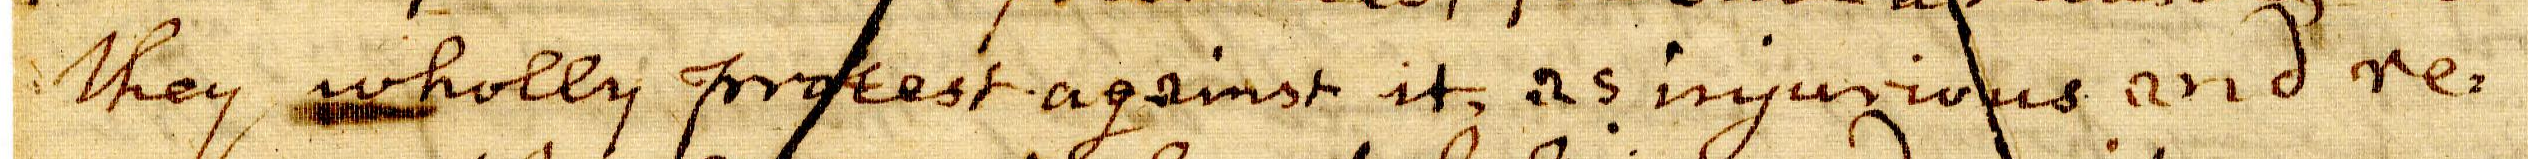they wholly protest against it, as injurious and re:
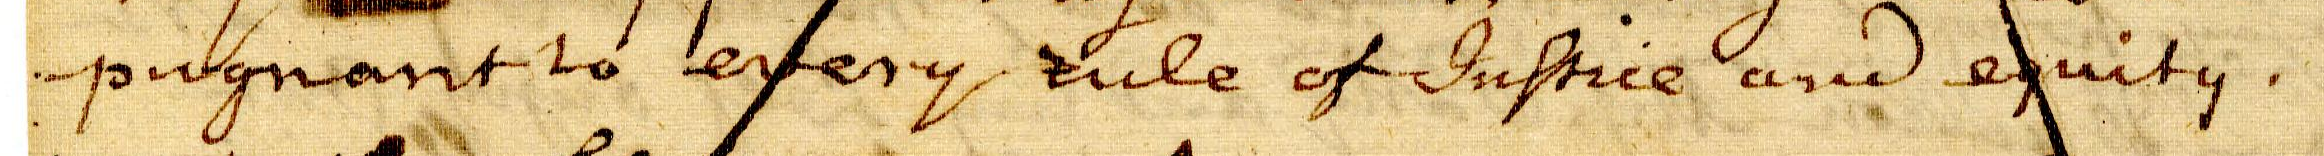-pugnant to every rule of Justice and equity.
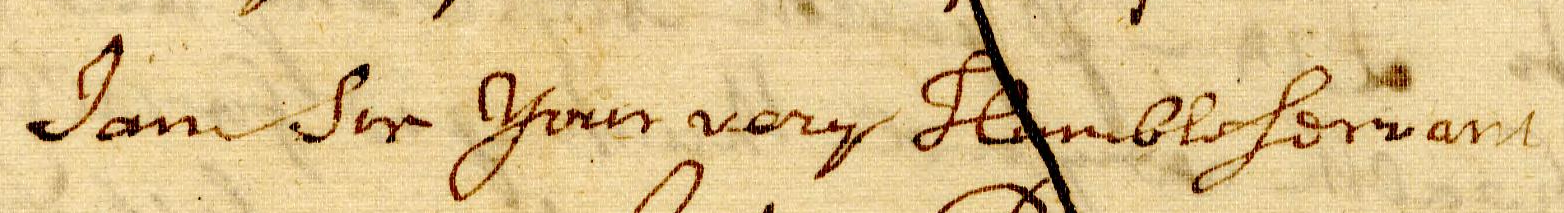I am Sir Your very Humble servant
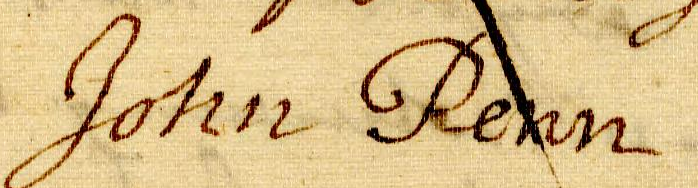John Penn
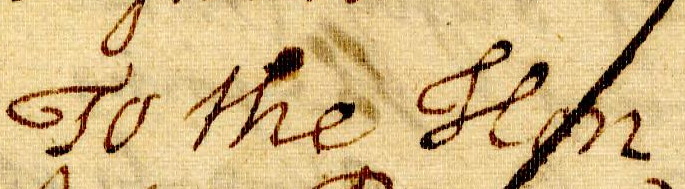To the Hon
